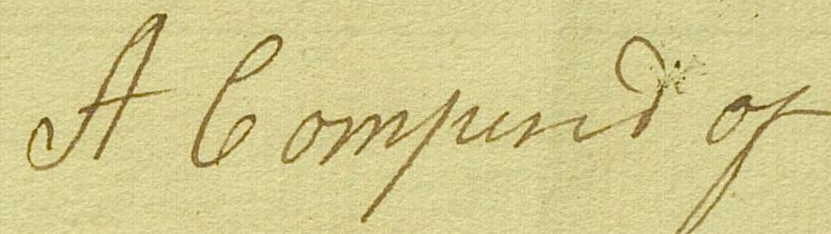A Compound of
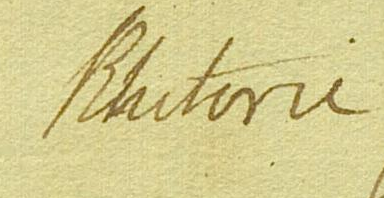Rhetoric
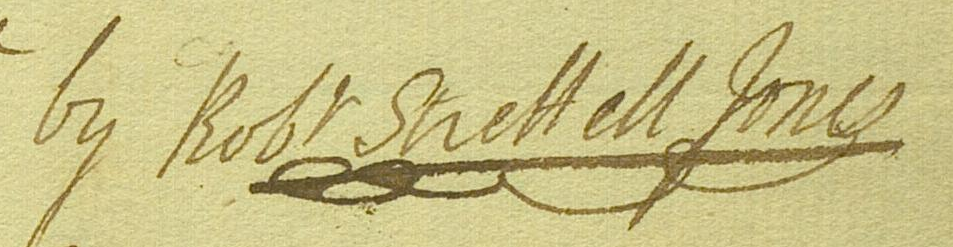by Rob^t Strettell Jones
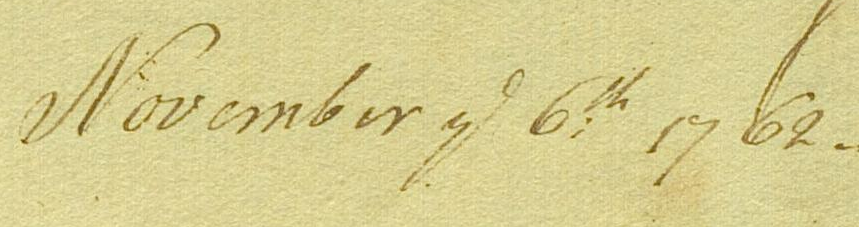November y^e 6^th 1762
